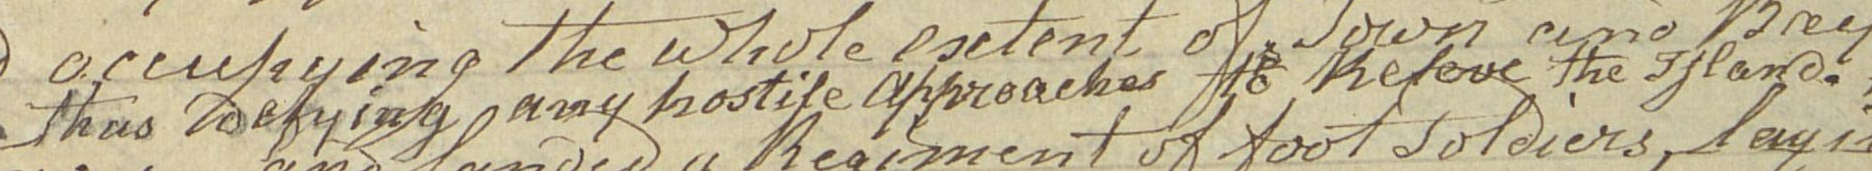thus defying any hostile approaches to Releve the Island.
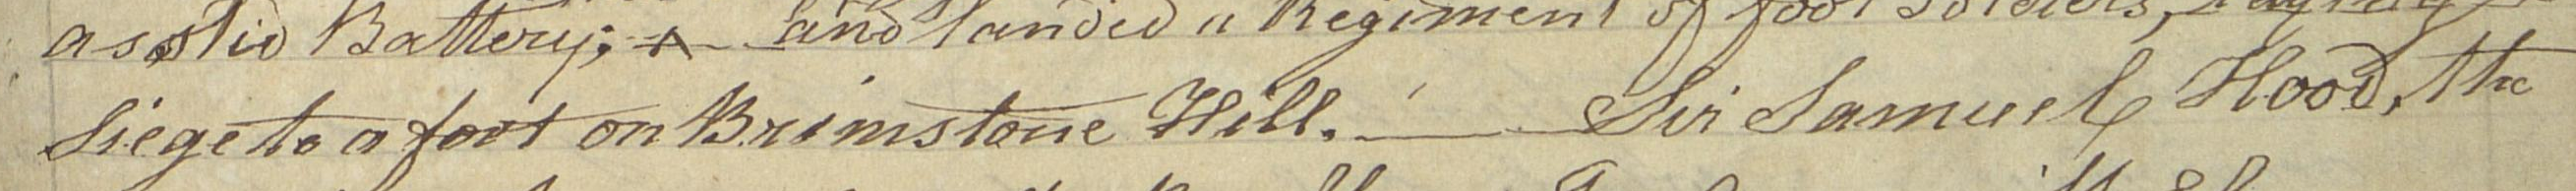Siege to a fort on Brimstone Hill. Sir Samuel Hood, the
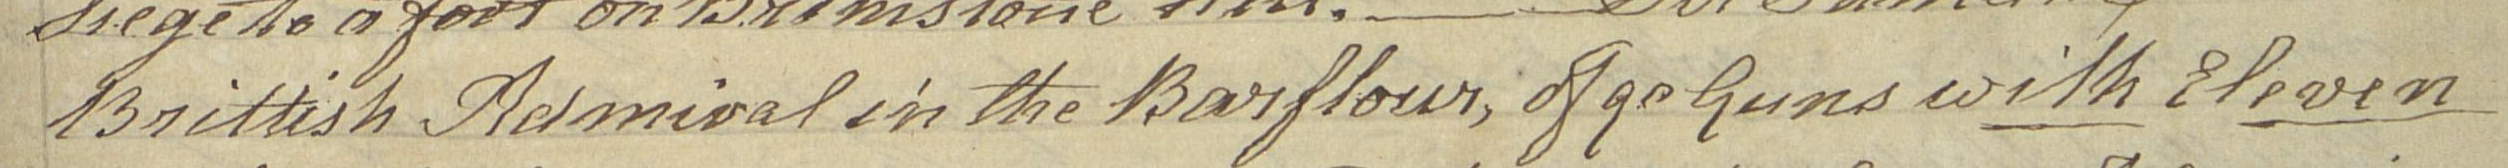Brittish Admiral in the Barflour of 90 Guns with Eleven
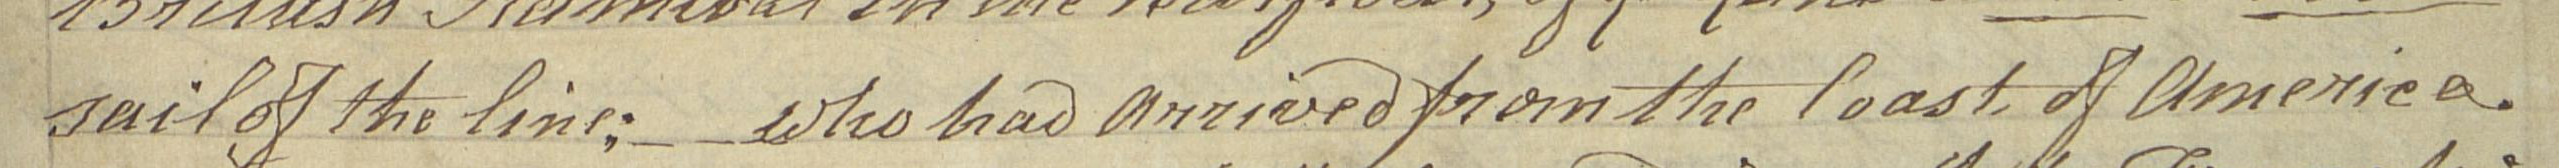sail of the line; who had arrived from the Coast of America.
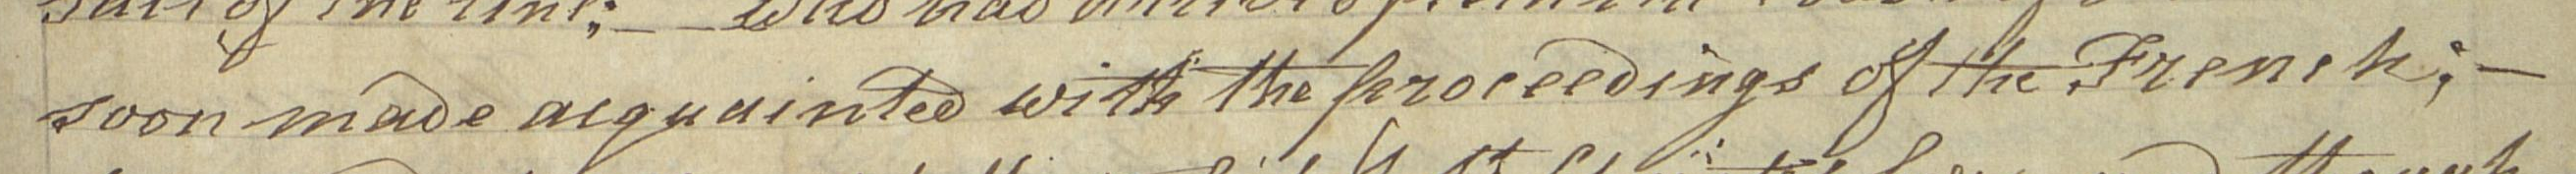soon made acquainted with the proceedings of the French;
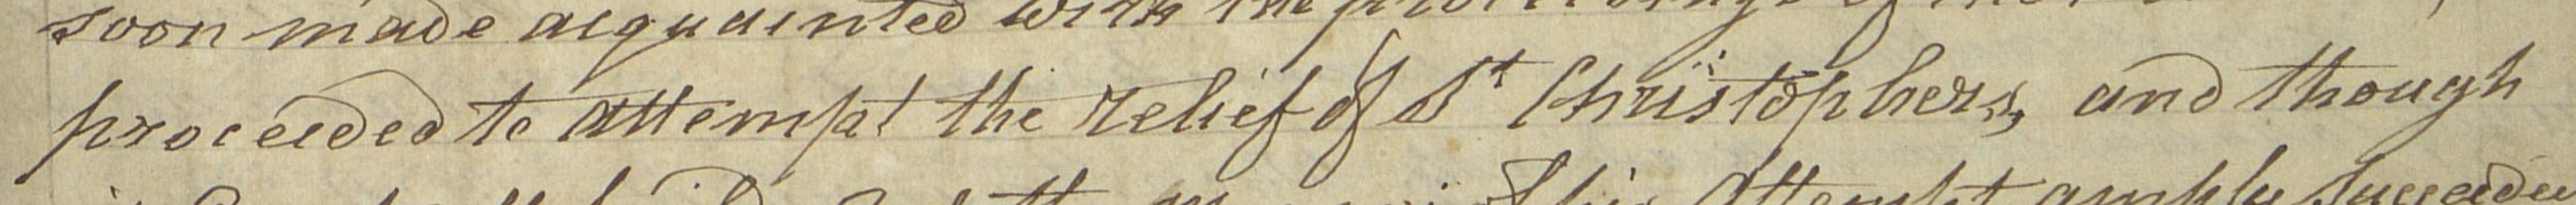proceeded to attempt the relief of S^t. Christophers, and though
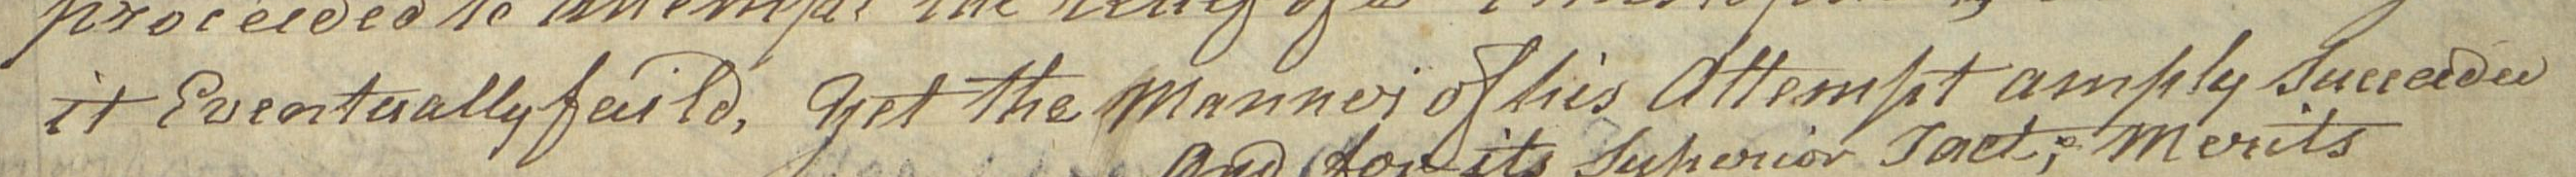it eventually faild, yet the manner of his Attempt amply succeeded
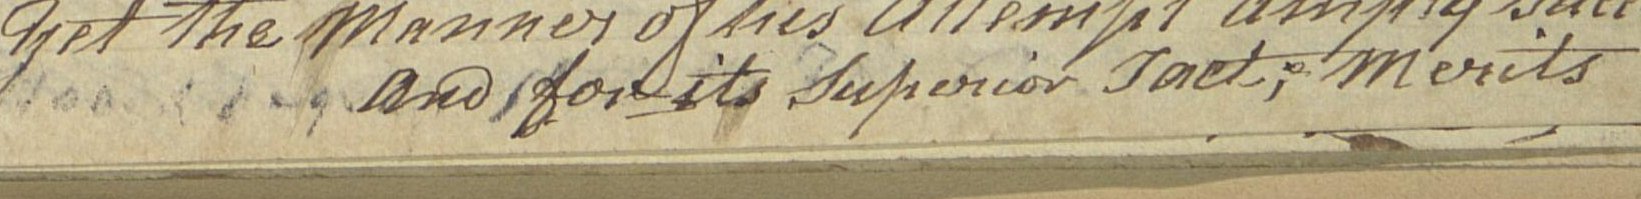and for its Superior Tact; Merits
